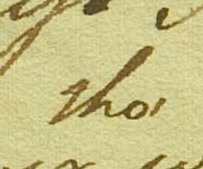tho'
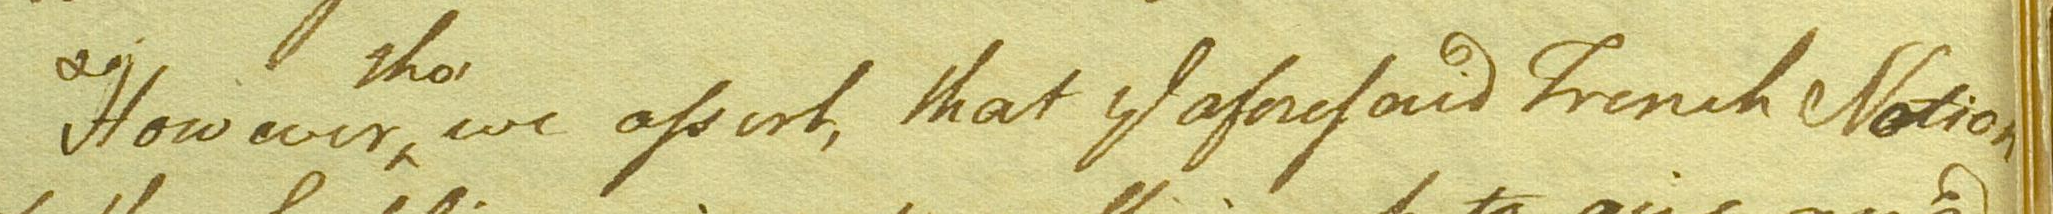However, ^ we assert, that y^e aforesaid French Notion
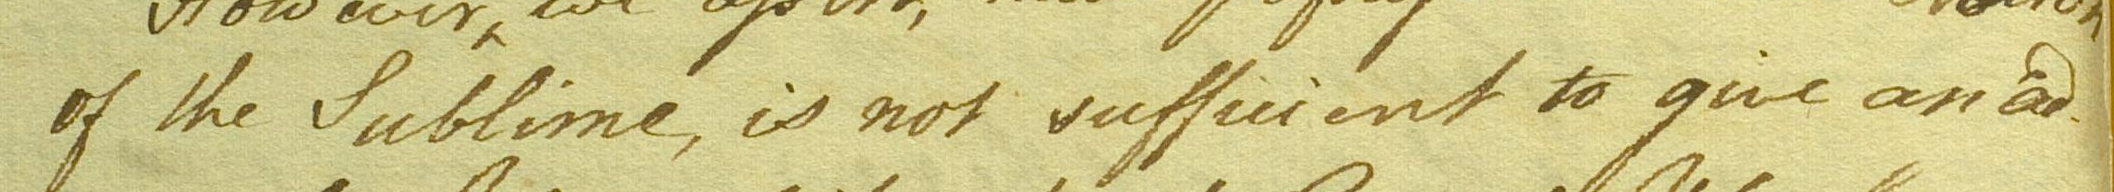of the Sublime, is not sufficient to give an ad-
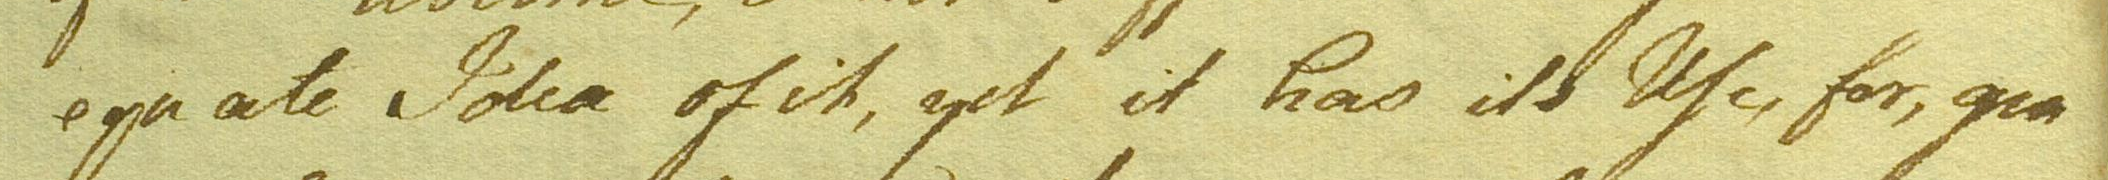equate Idea of it, yet it has its Use, for, gen
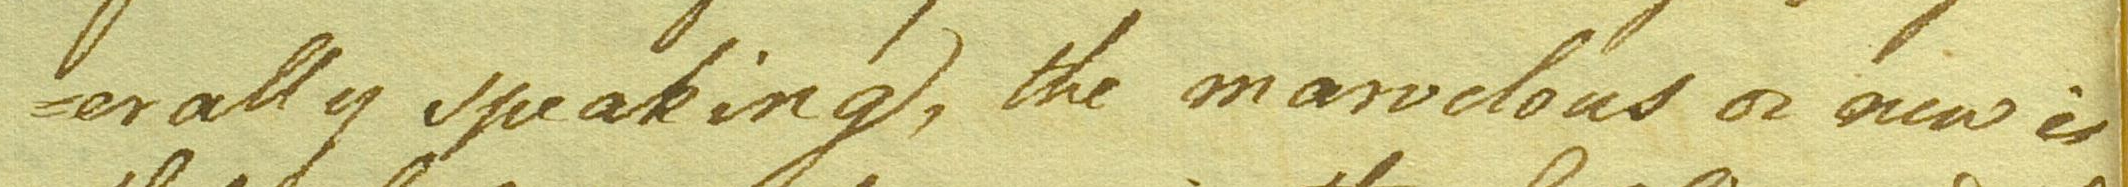-erally speaking, the marvelous or new is
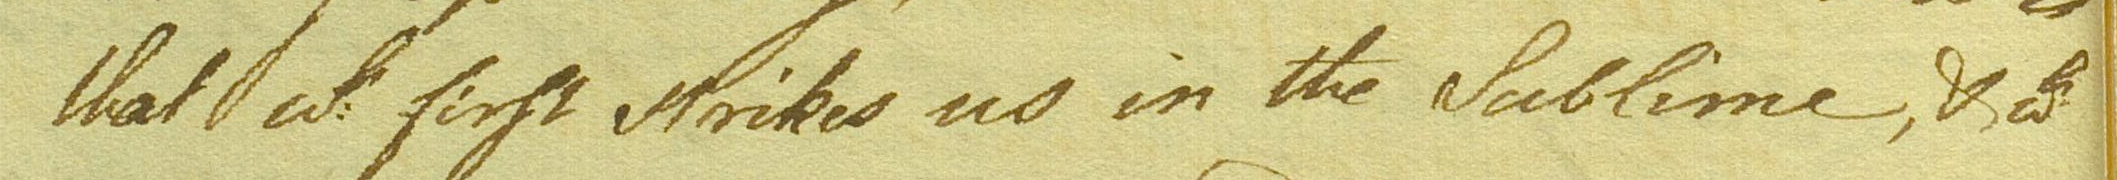that w^h: first strikes us in the Sublime, & w^h:
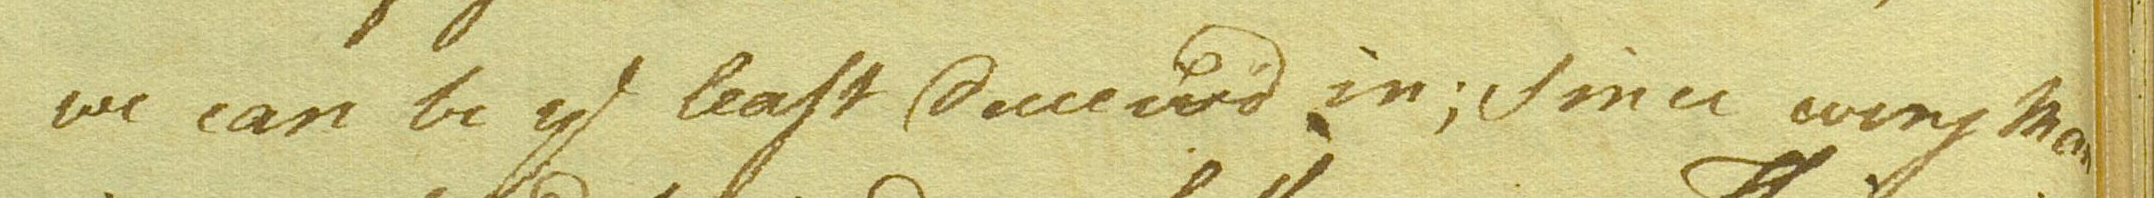we can be y^e least deceived in; since every Man
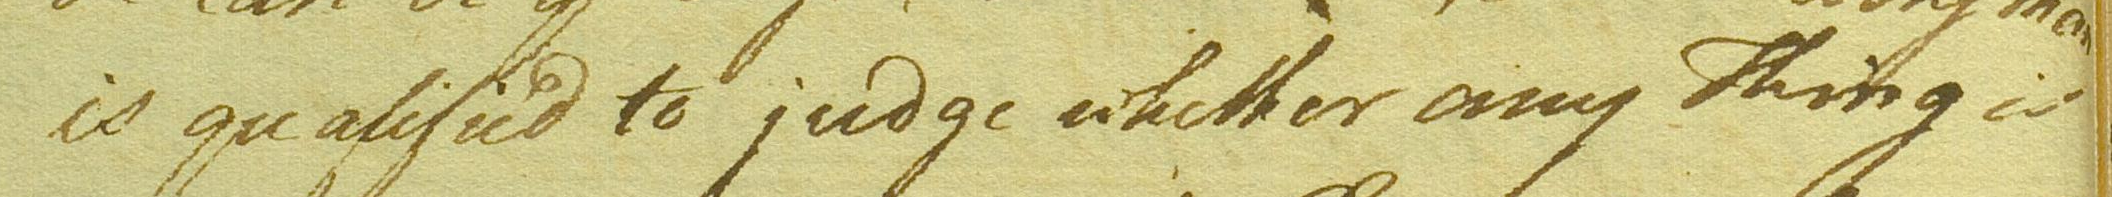is qualified to judge whether any Thing is
